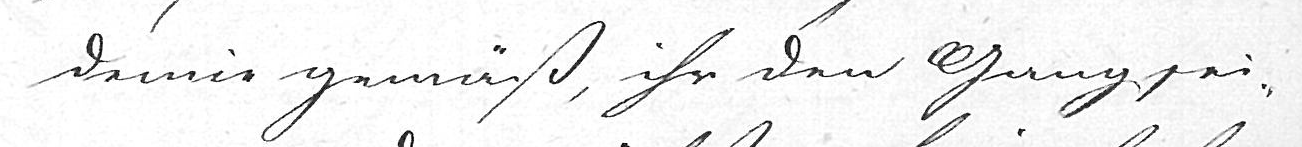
demie gemäß, ihr den Gang sei-
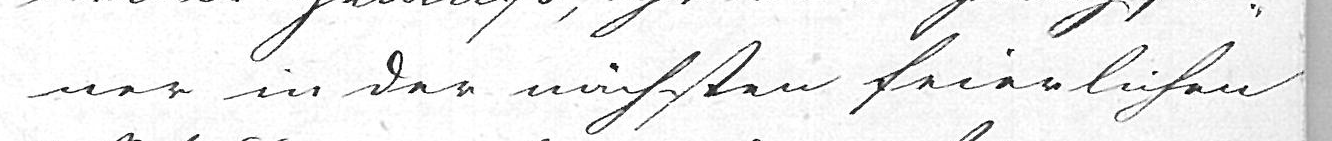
ner in der nächsten feierlichen
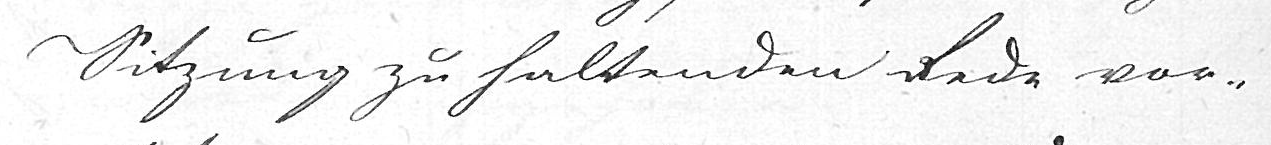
Sitzung zu haltenden Rede vor-
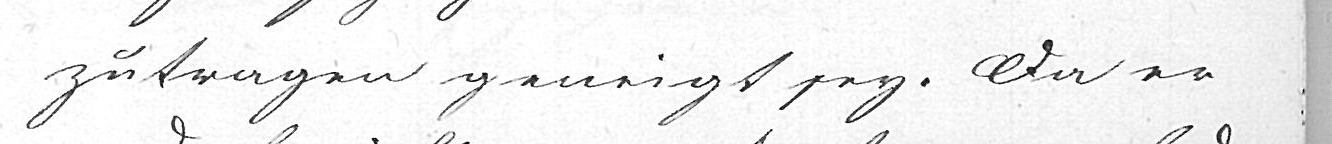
zutragen geneigt sey. Da er-
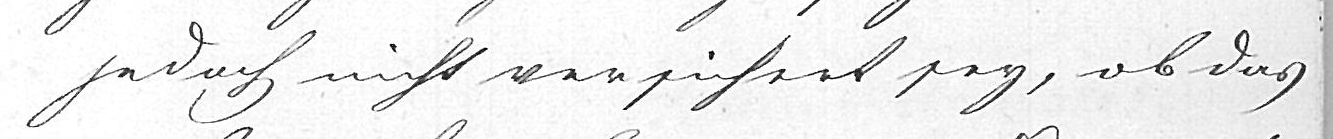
jedoch nicht versichert sey, ob das
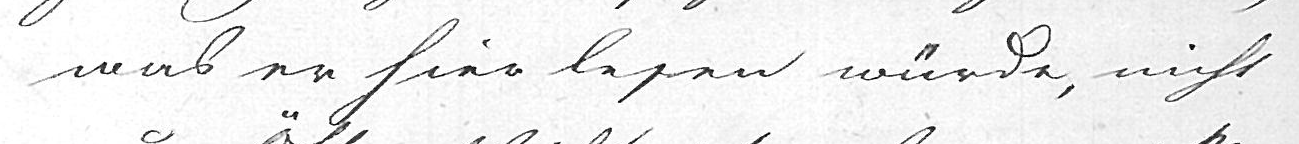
was er hier lesen würde, nicht
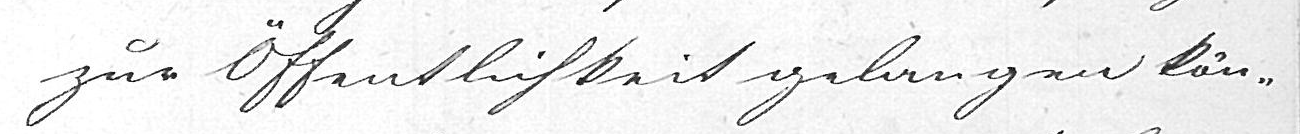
zur Öffentlichkeit gelangen kön-
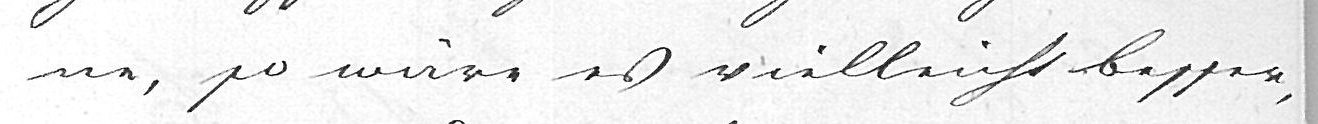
ne, so wäre es vielleicht besser
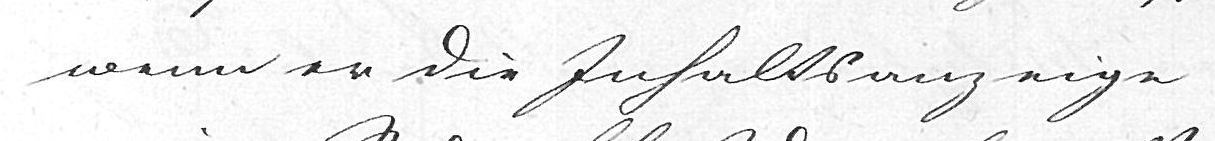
wenn er die Inhaltsanzeige
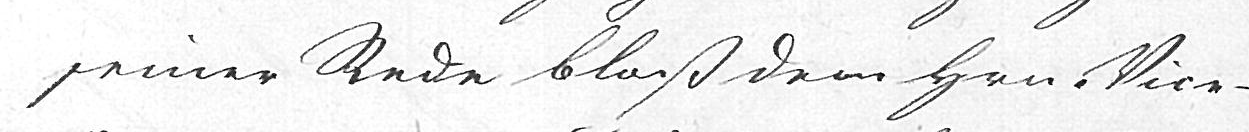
seiner Rede bloß dem Hrn. Vice-
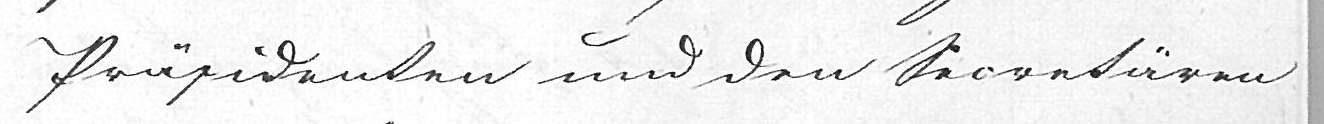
Präsidenten und den Secretären
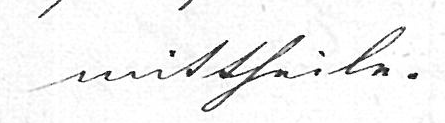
mittheile.
